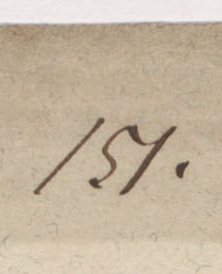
157.
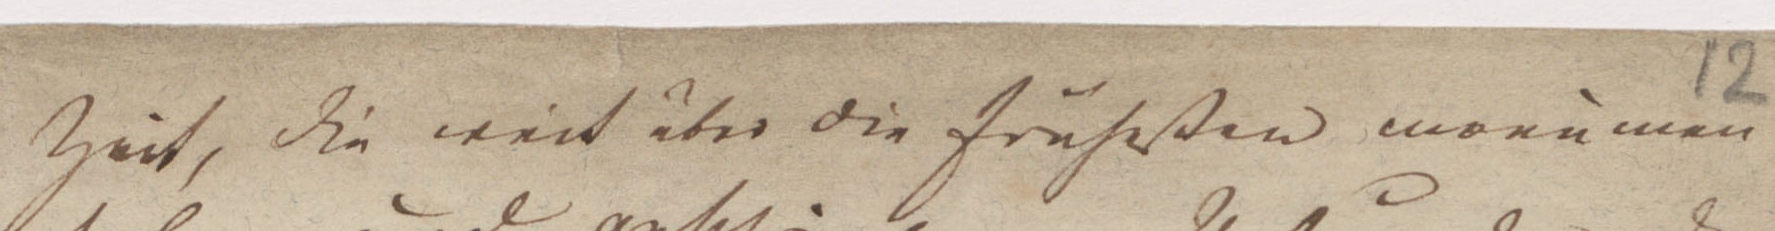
die weit über die frühesten monumen-
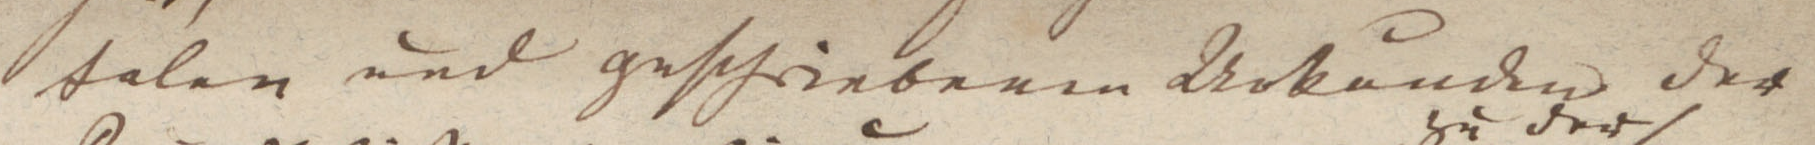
talen und geschriebenen Urkunden der
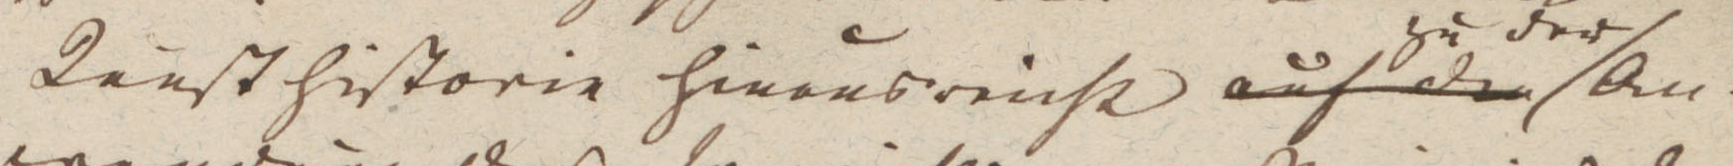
Kunsthistorie hinausreicht auf die zu der
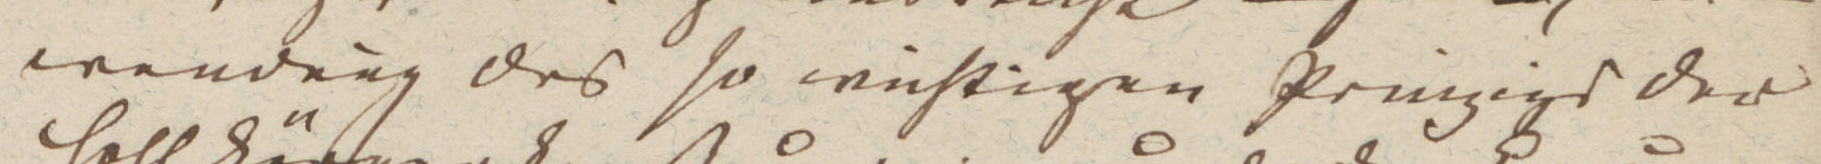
wendung des so wichtigen Prinzips der
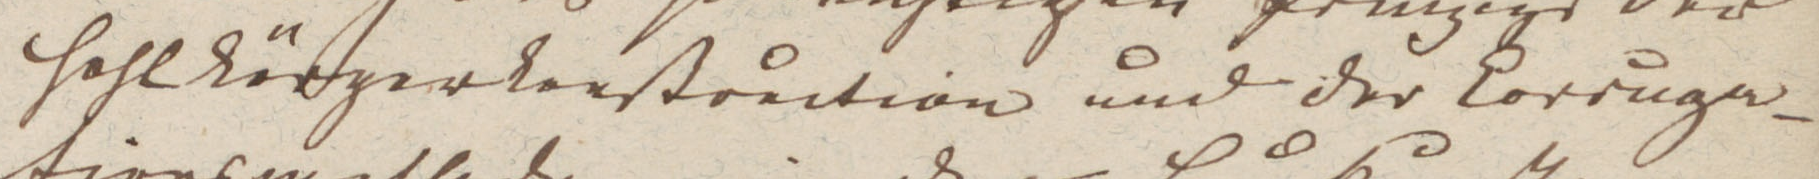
Hohlkörperkonstruction und der Corruga-
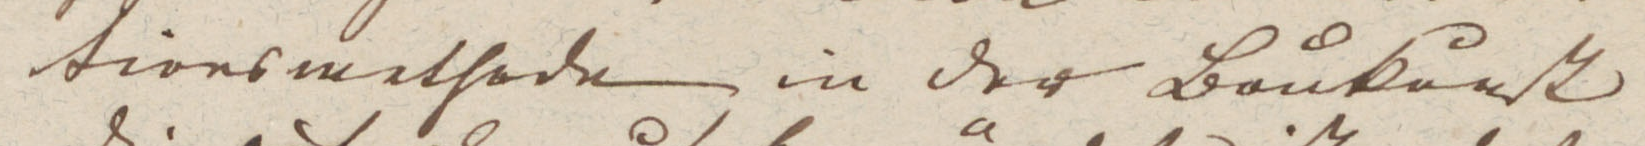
tionsmethode in der Baukunst,
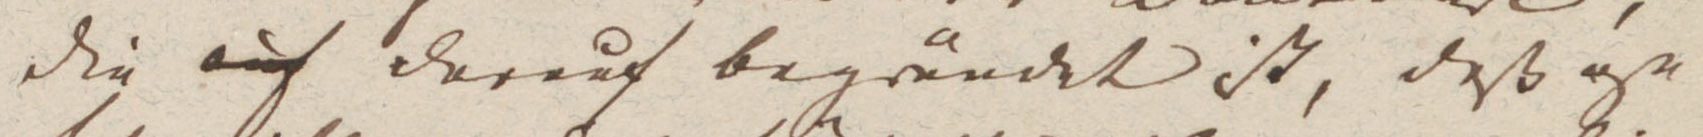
die auf darauf begründet ist, dass ge-
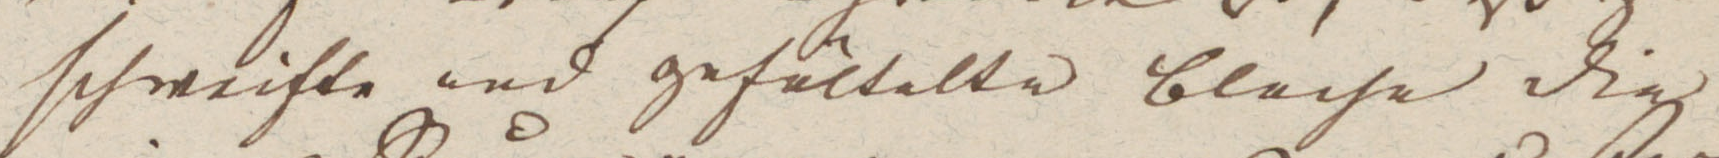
schweifte und gefältelte Bleche die
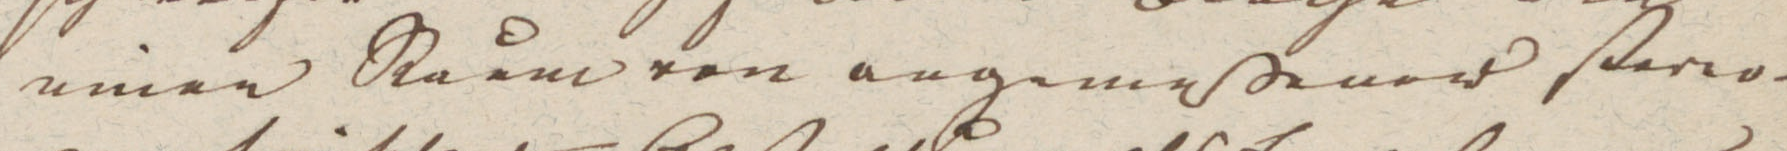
einen Raum von angemessener stereo-
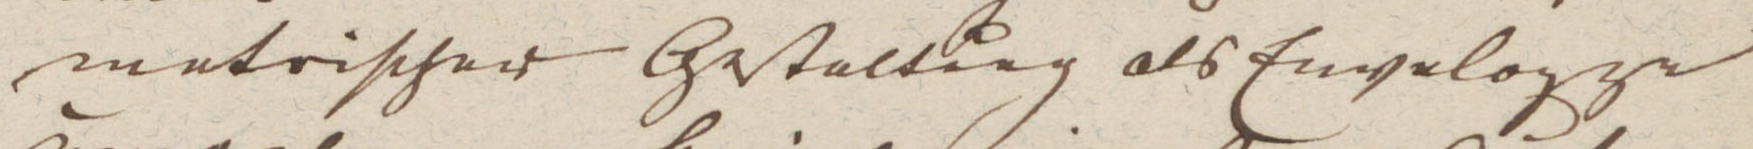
metrischer Gestaltung als Enveloppe
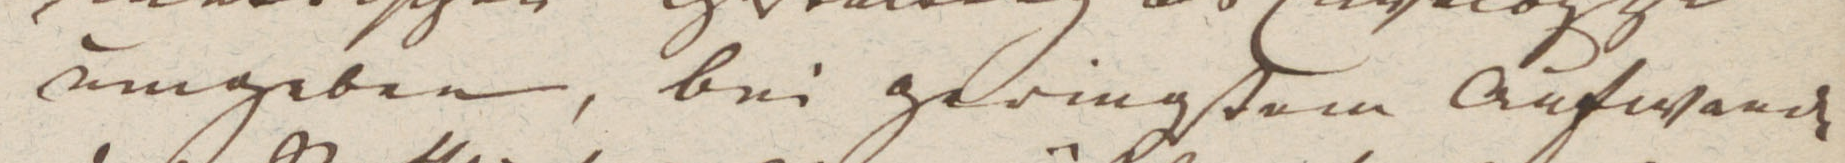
umgeben, bei geringstem Aufwande
